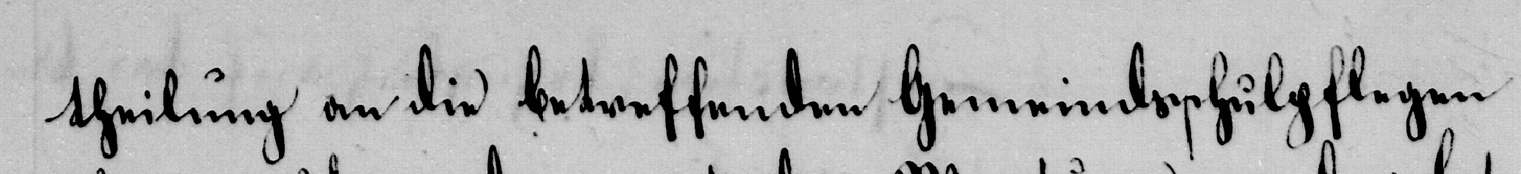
theilung an die betreffenden Gemeindschulpflegen
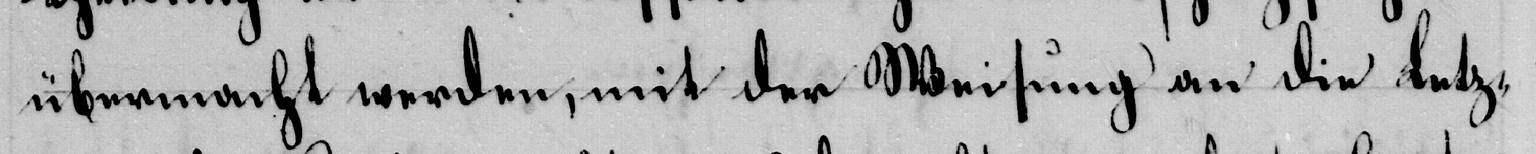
übermacht werden, mit der Weisung an die Letz¬
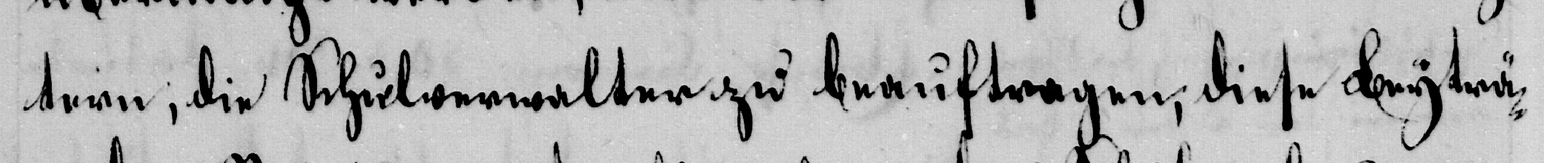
tern, die Schulverwalter zu beauftragen, diese Beyträ¬
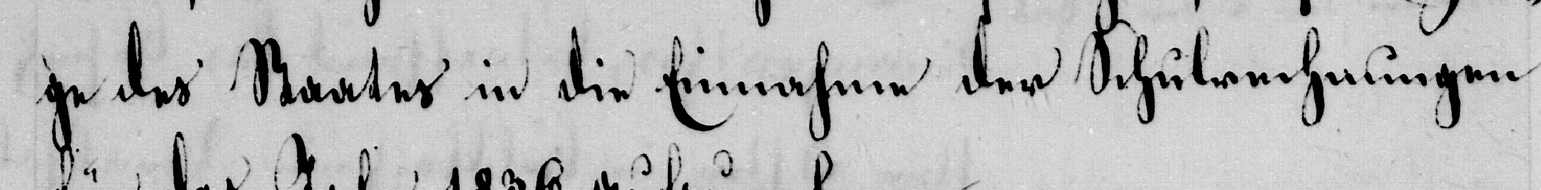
ge des Staates in die Einnahme der Schulrechnungen
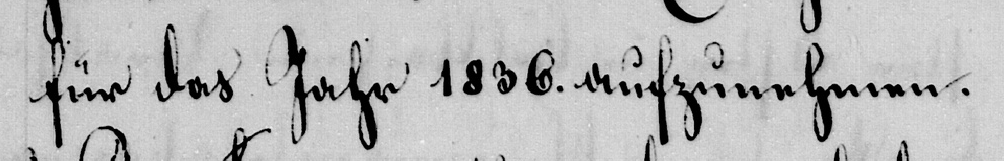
für das Jahr 1836. aufzunehmen.
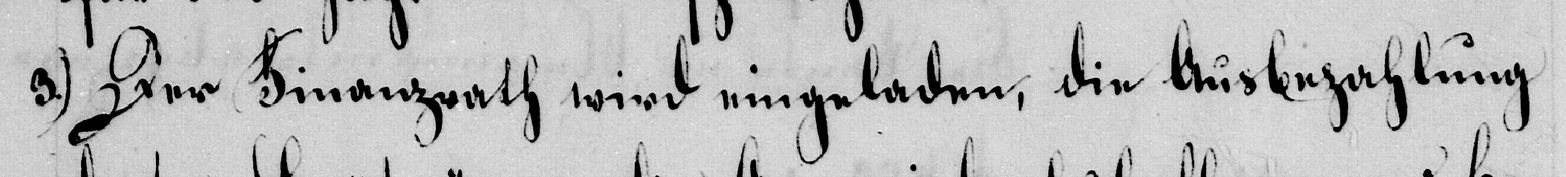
3.) Der Finanzrath wird eingeladen, die Ausbezahlung
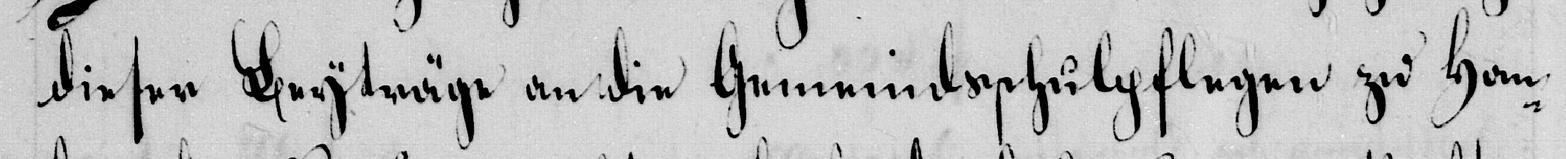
dieser Beyträge an die Gemeindschulpflegen zu Han¬
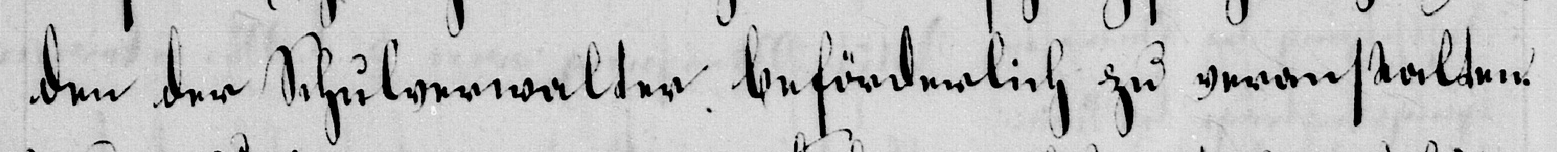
den der Schulverwalter beförderlich zu veranstalten.
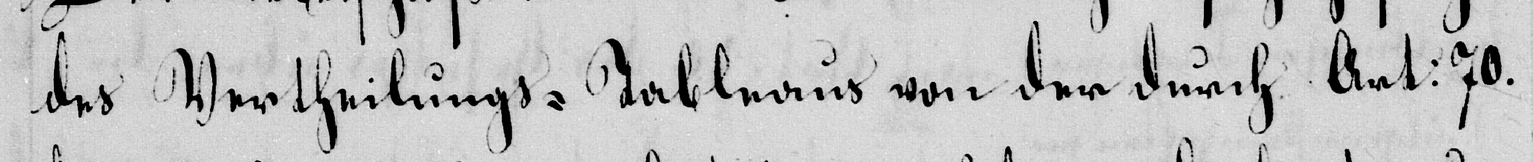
des Vertheilungs-Tableaus von der durch Art: 70.
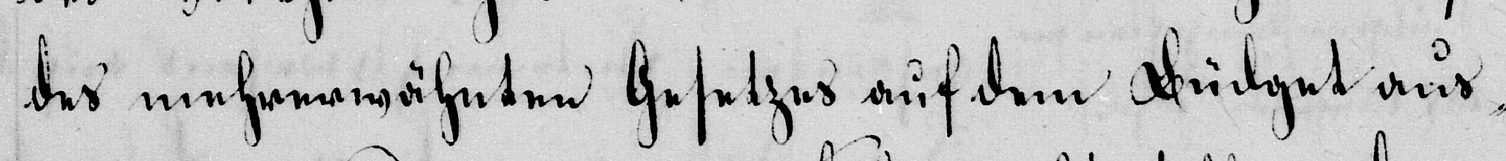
des mehrerwähnten Gesetzes auf dem Büdget aus¬
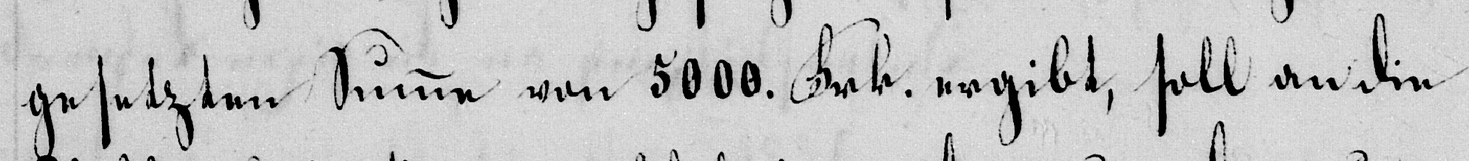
gesetzten Summe von 5000. Frk. ergibt, soll an die
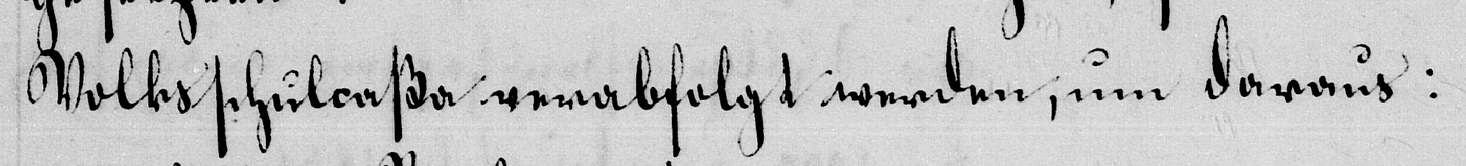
Volksschulcaßa verabfolgt werden, um daraus:
